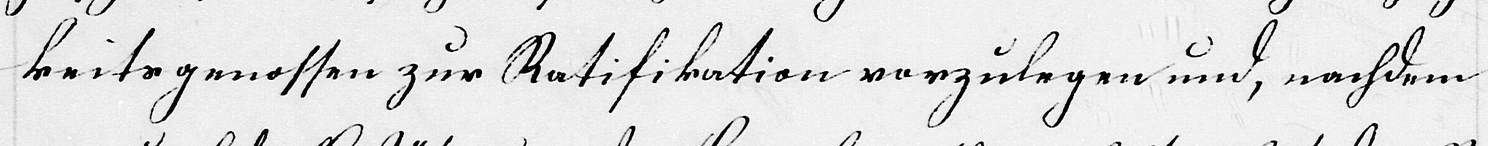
keitsgenossen zur Ratifikation vorzulegen und, nachdem
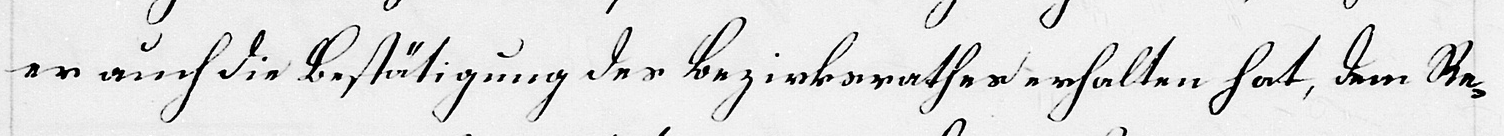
er auch die Bestätigung des Bezirksrathes erhalten hat, dem Re¬
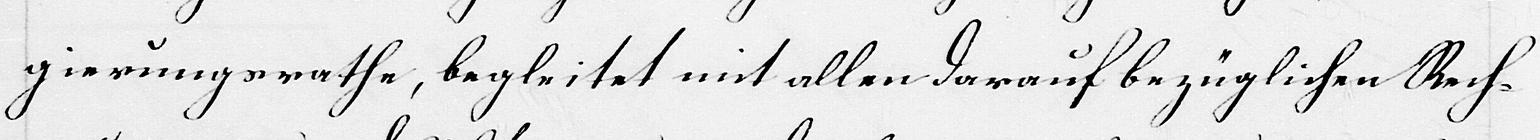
gierungsrathe, begleitet mit allen darauf bezüglichen Rech¬
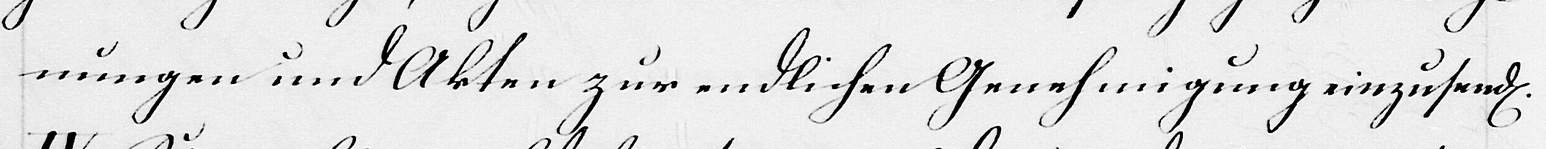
nungen und Akten zur endlichen Genehmigung einzusend[e¬
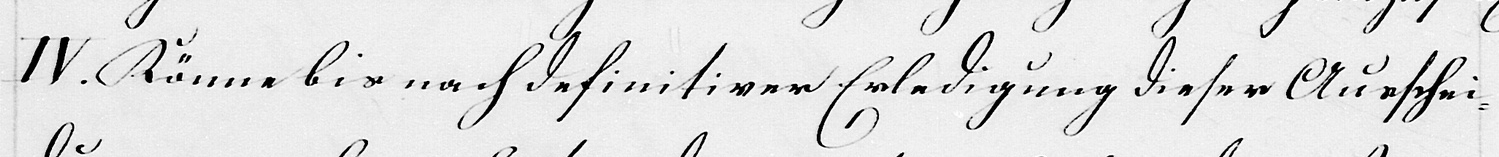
IV. Könne bis nach definitiver Erledigung dieser Ausschei¬
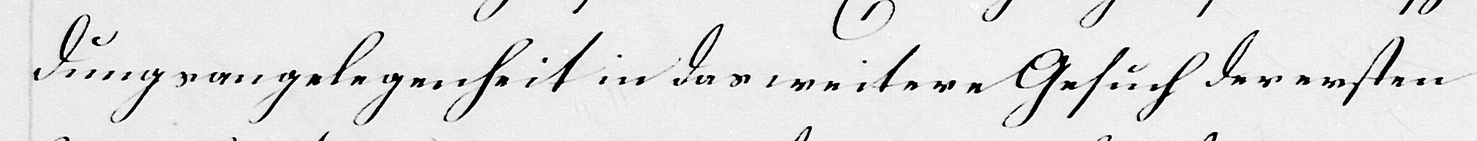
dungsangelegenheit in das weitere Gesuch der ersten
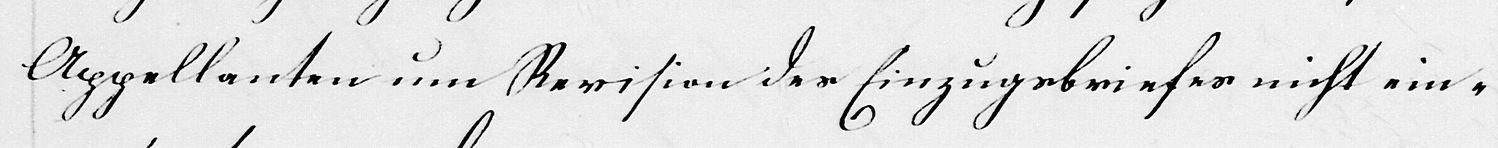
Appellanten um Revision des Einzugsbriefes nicht ein¬
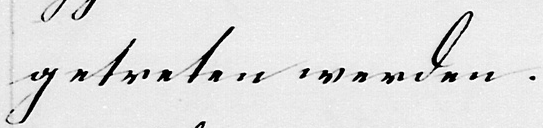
getreten werden.
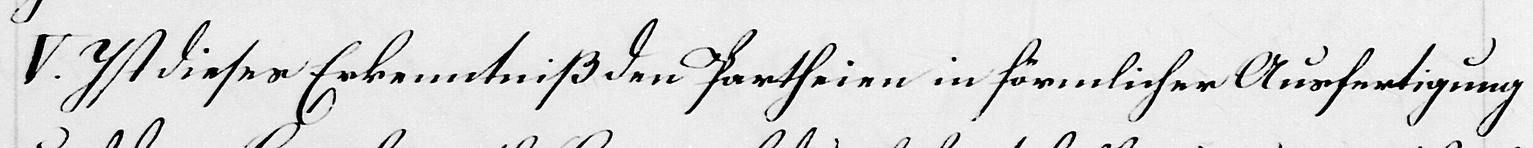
V. Ist dieses Erkenntniß den Partheien in förmlicher Ausfertigung
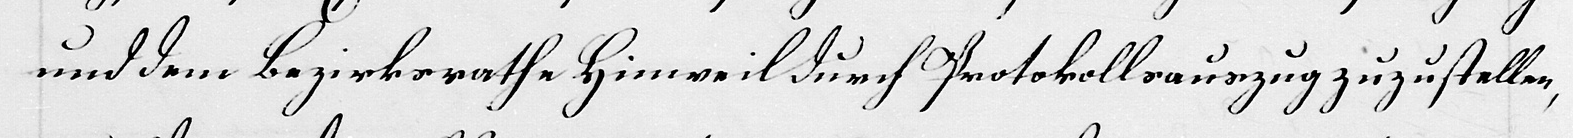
und dem Bezirksrathe Hinweil durch Protokollsauszug zuzustellen,
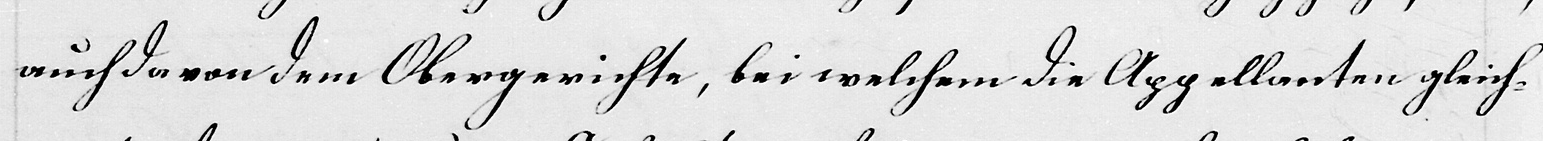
auch davon dem Obergerichte, bei welchem die Appellanten gleich¬
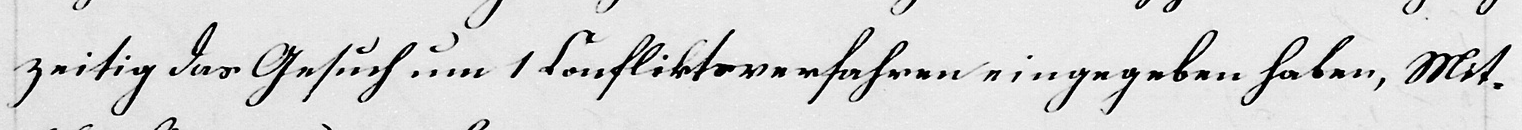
zeitig das Gesuch um 1 Confliktsverfahren eingegeben haben, Mit¬
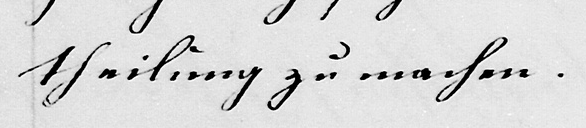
theilung zu machen.
